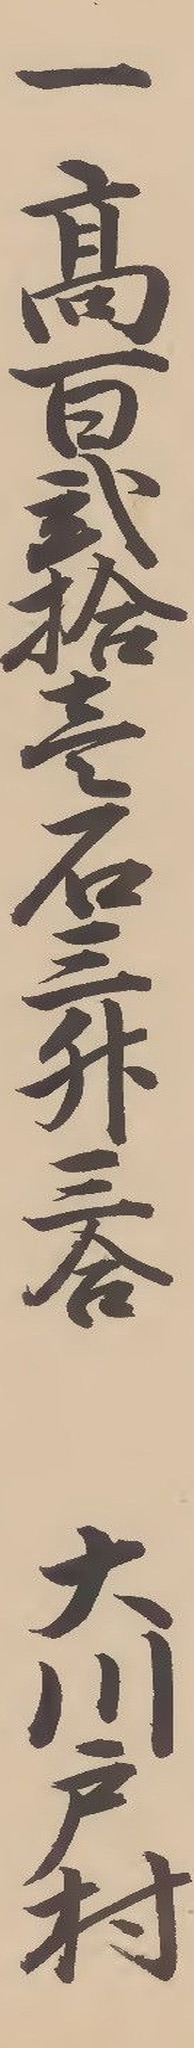一高百弐拾壱石三升三合大川戸村
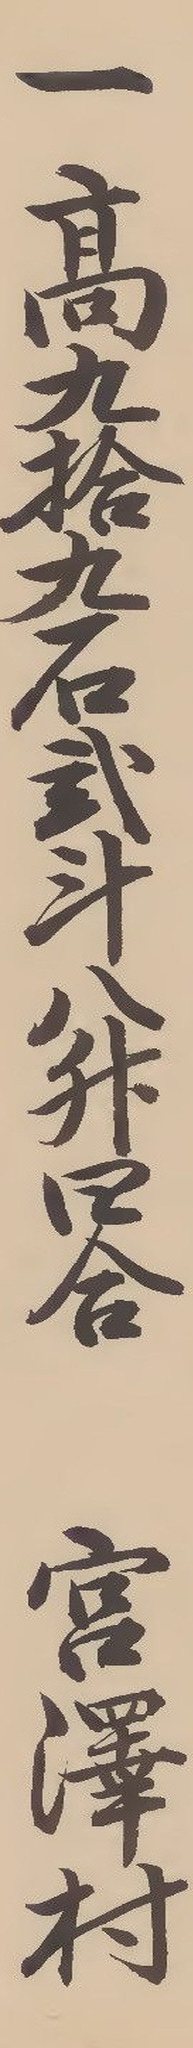一高九拾九石弐斗八升四合宮沢村
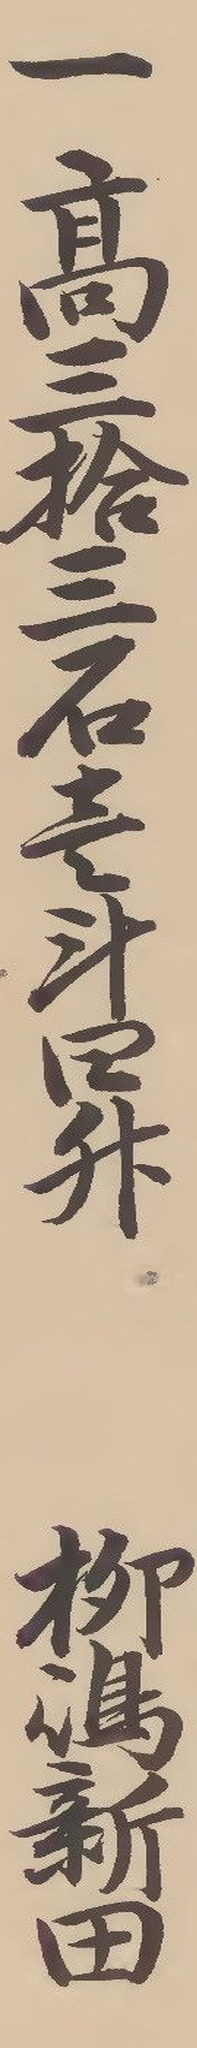一高三拾三石壱斗四升柳島新田

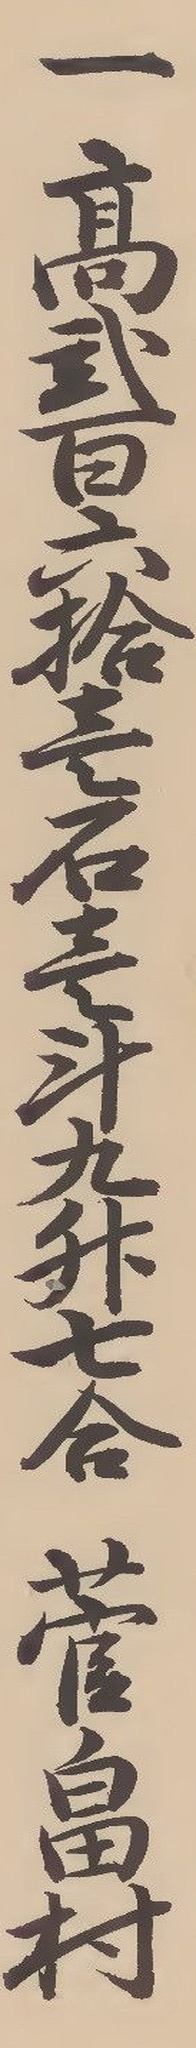一高弐百六拾壱石壱斗九升七合菅畠村
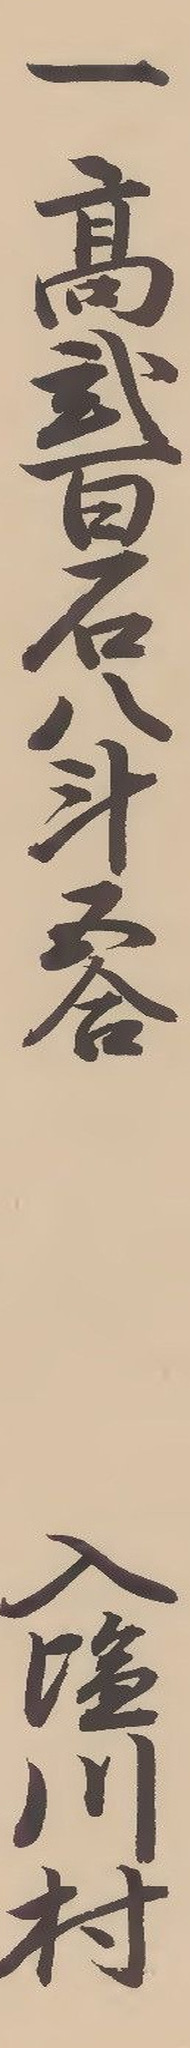一高弐百石八斗五合入塩川村
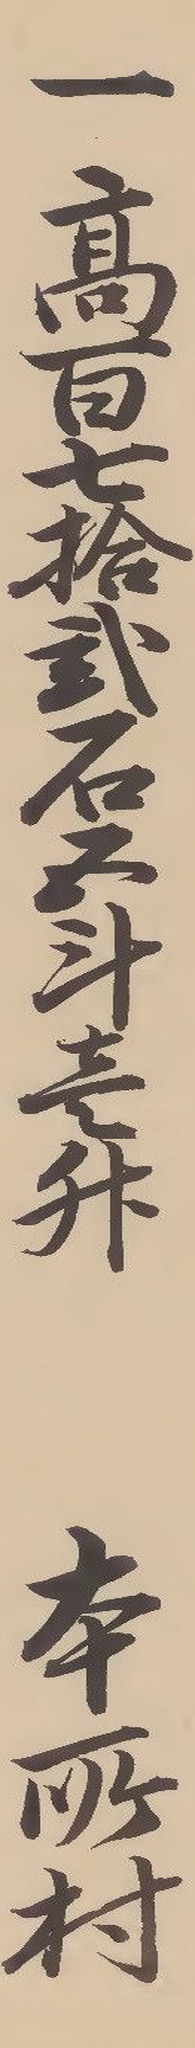一高百七拾弐石五斗壱升本所村
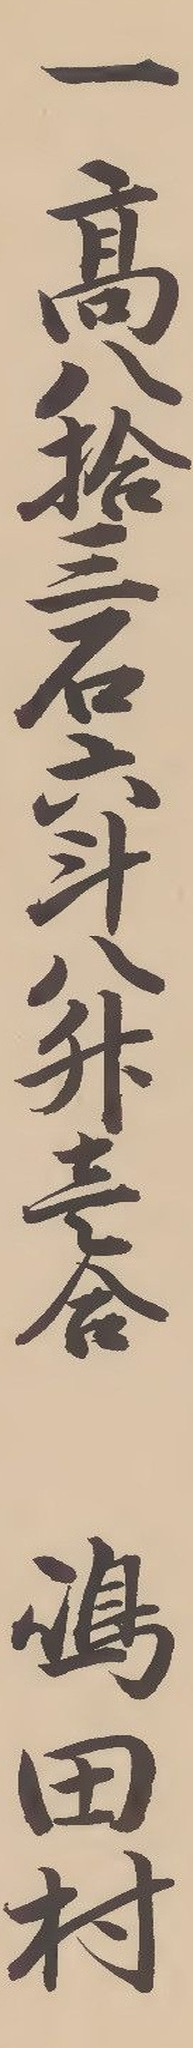一高八拾三石六斗八升壱合島田村
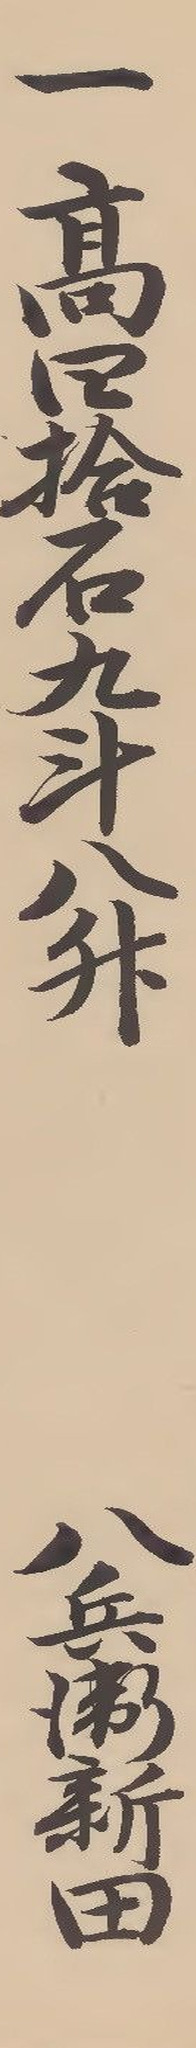一高四拾石九斗八升八兵衛新田
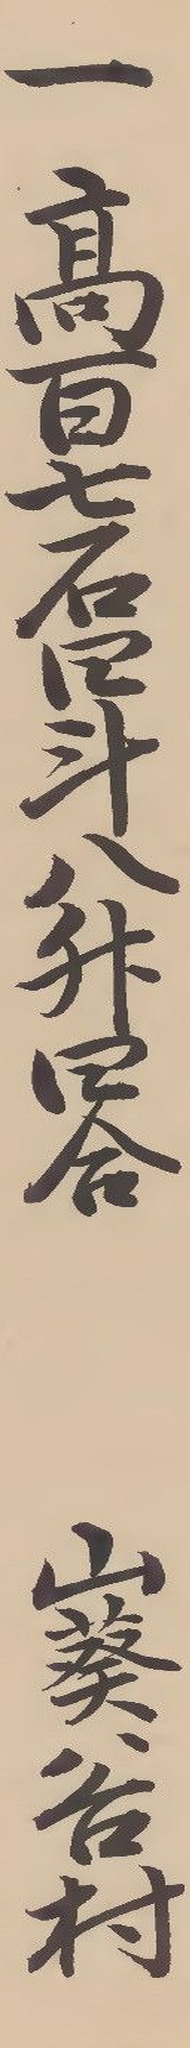一高百七石四斗八升四合山葵谷村
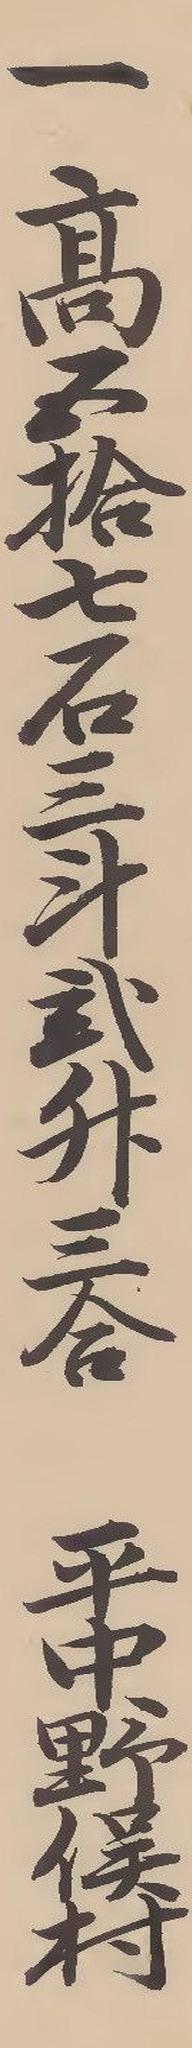一高五拾七石三斗弐升三合平中野俣村
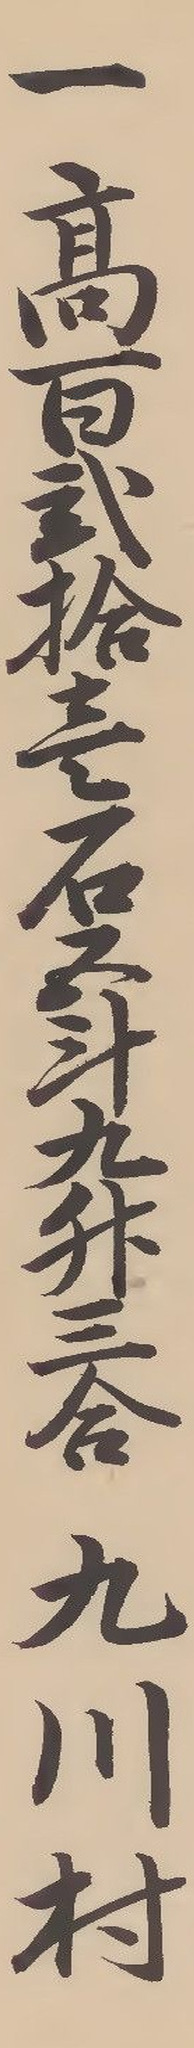一高百弐拾壱石五斗九升三合九川村

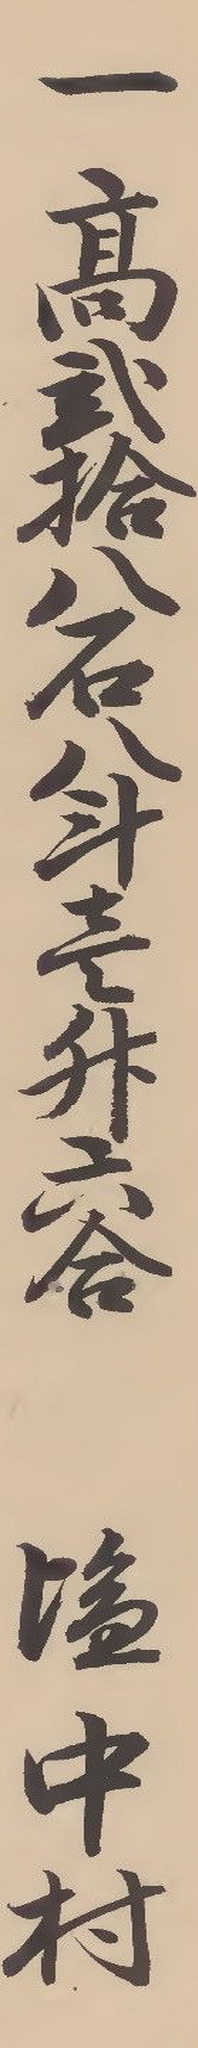一高弐拾八石八斗壱升六合塩中村
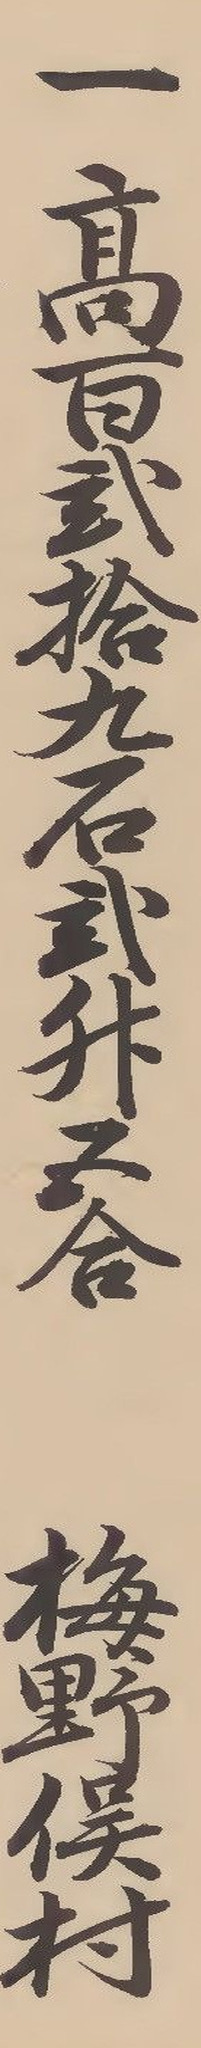一高百弐拾九石弐升五合梅野俣村
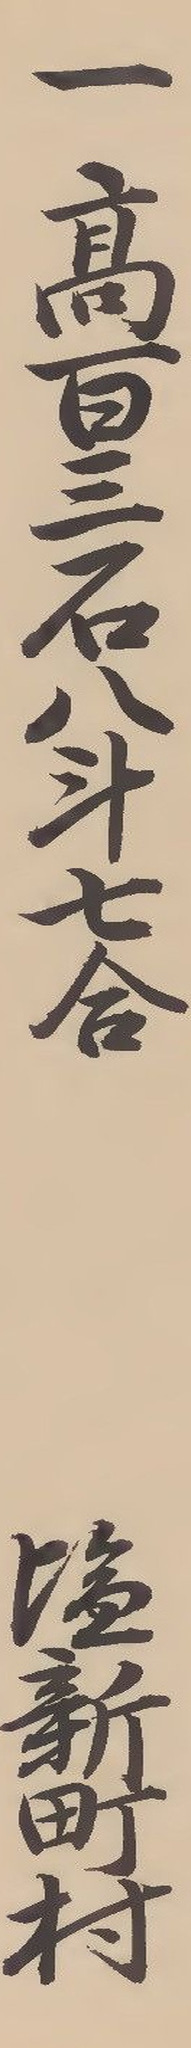一高百三石八斗七合塩新町村
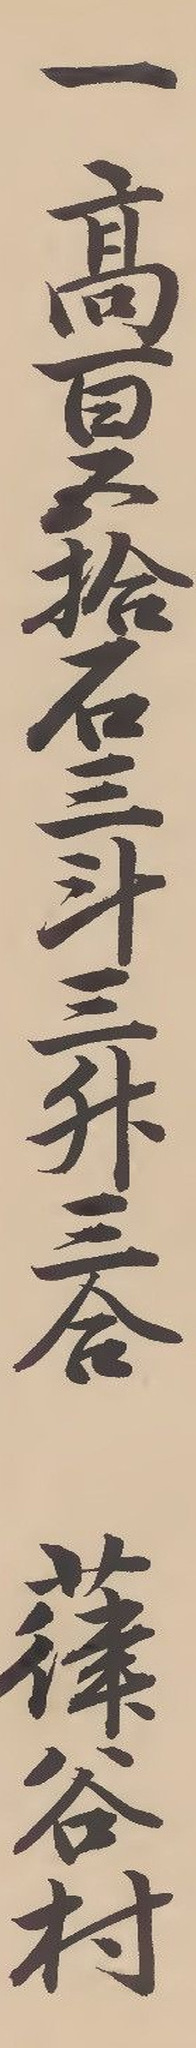一高百五拾石三斗三升三合葎谷村
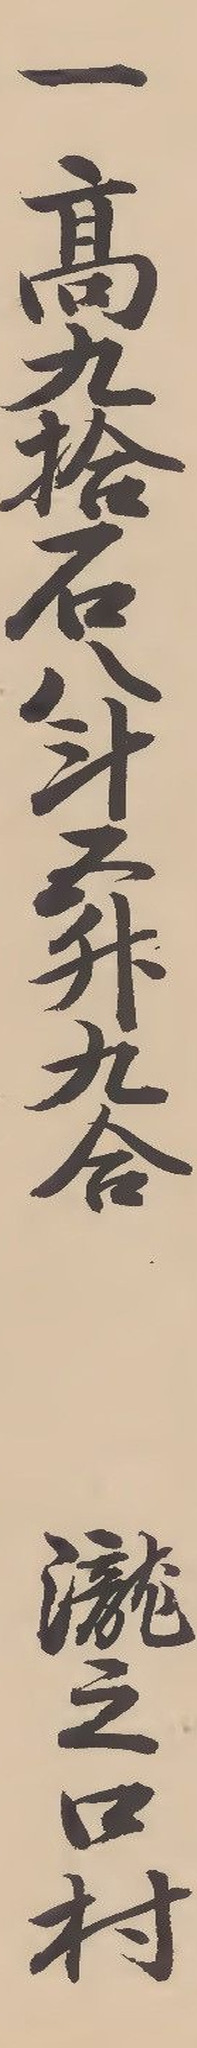一高九拾石八斗五升九合滝之口村
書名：越後国郷帳　中
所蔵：国立公文書館 National Archives of Japan
